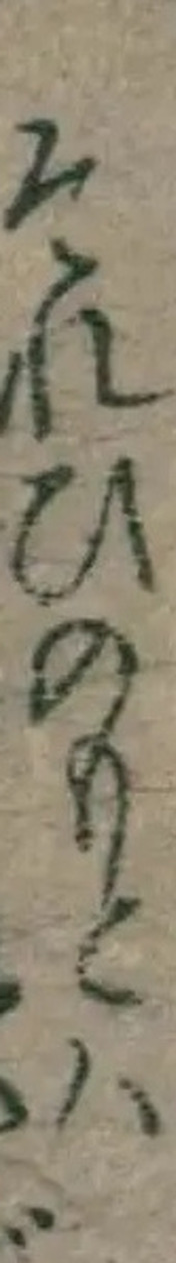それひのもとは
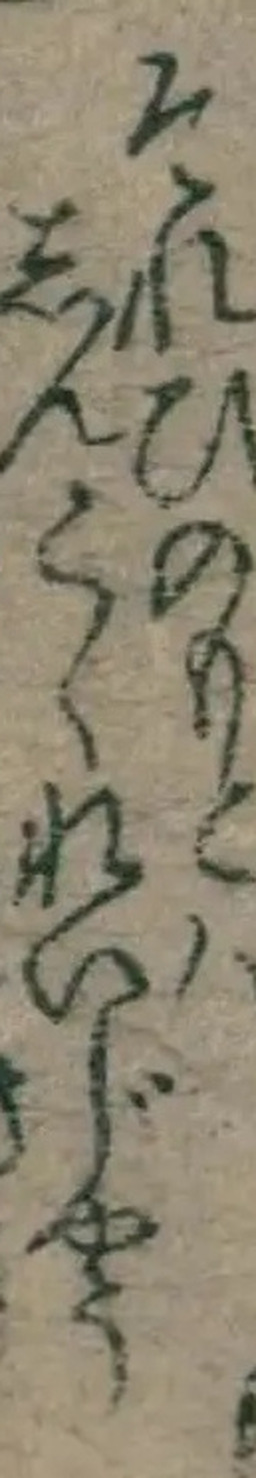しんこくれいじやう
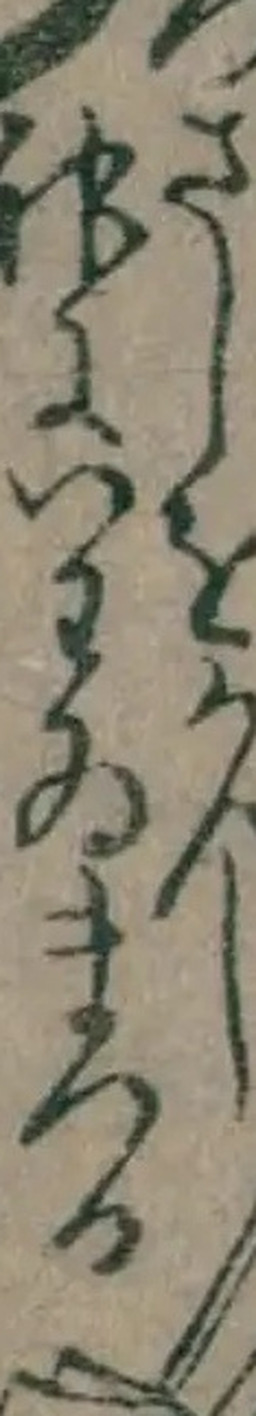神にいわゐまつる

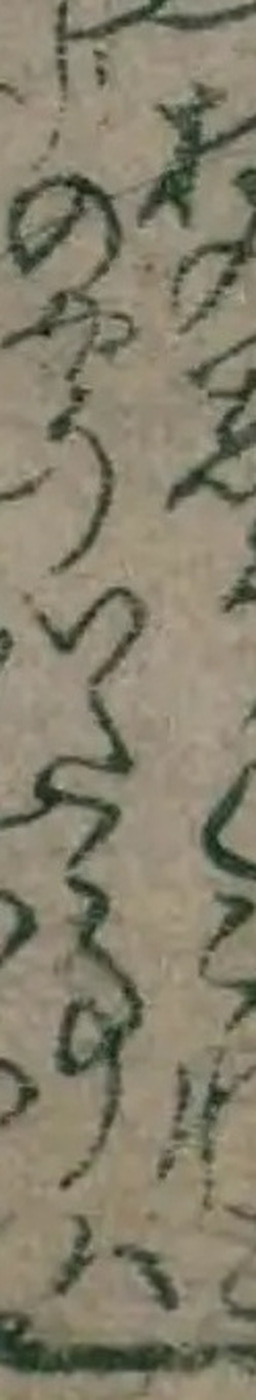のやういた事は
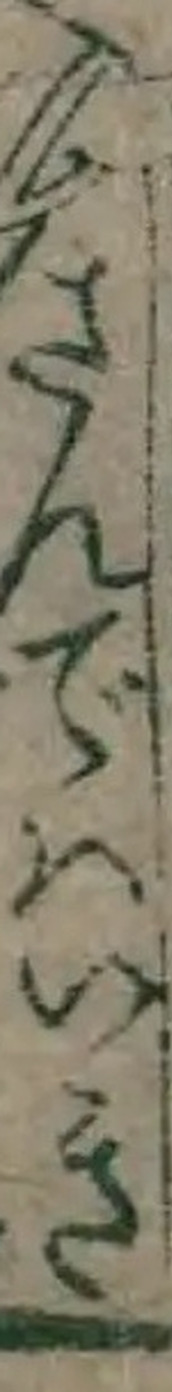さんではいき
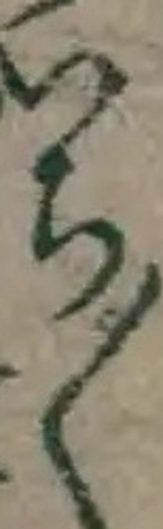みち〳〵
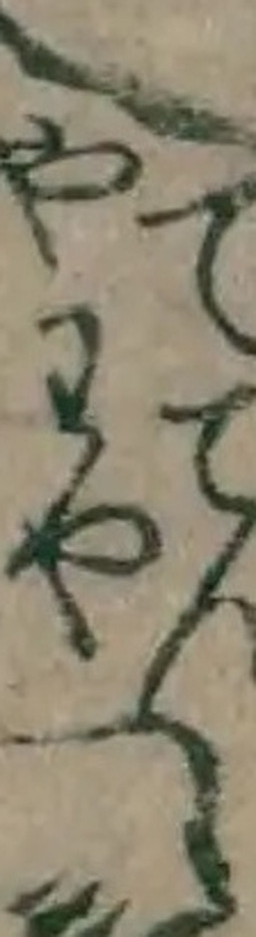やわや
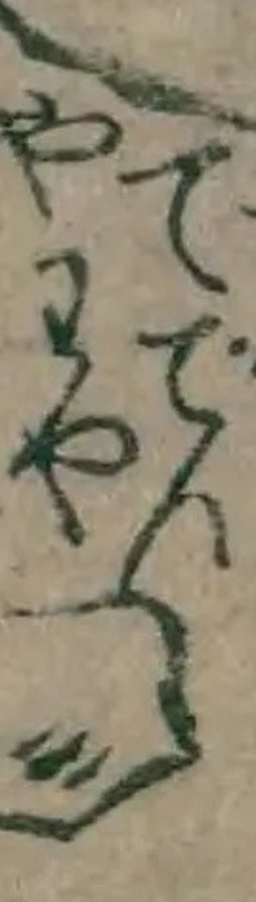やわや
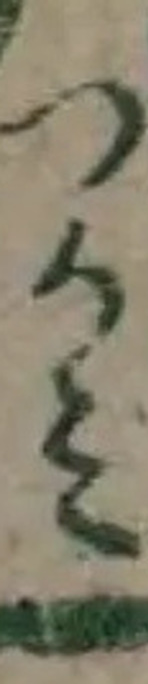つかみ
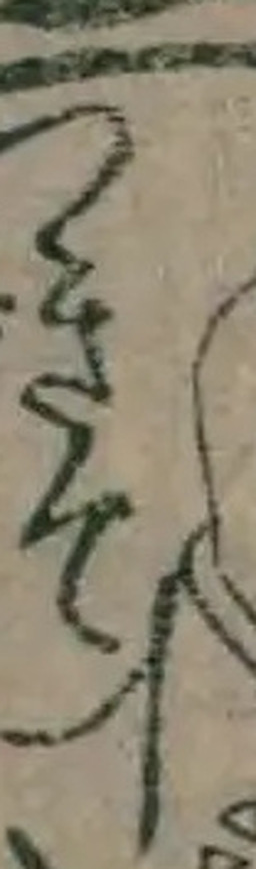つきて
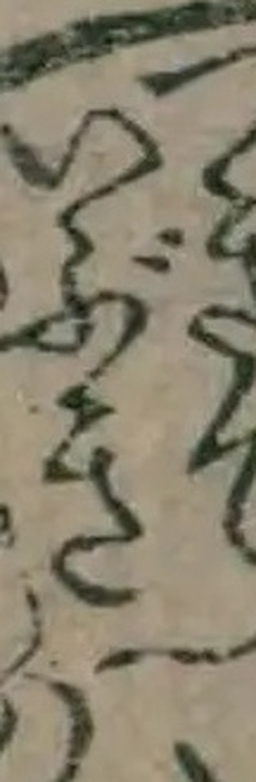いぶき
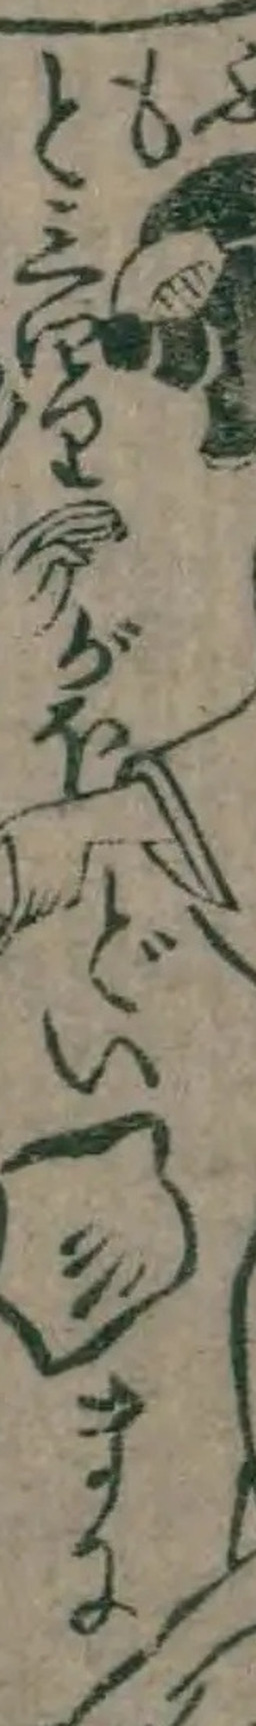と三四里がほどいまに
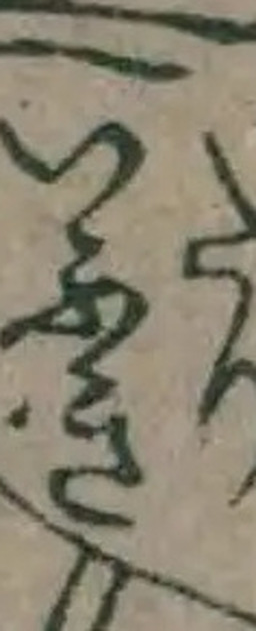いぶき
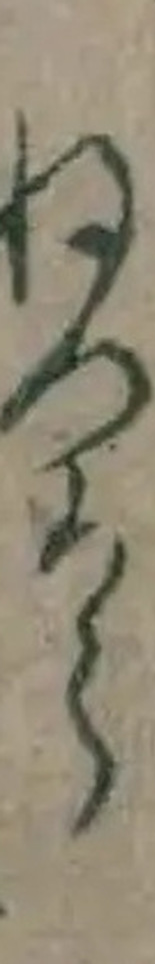ねつから
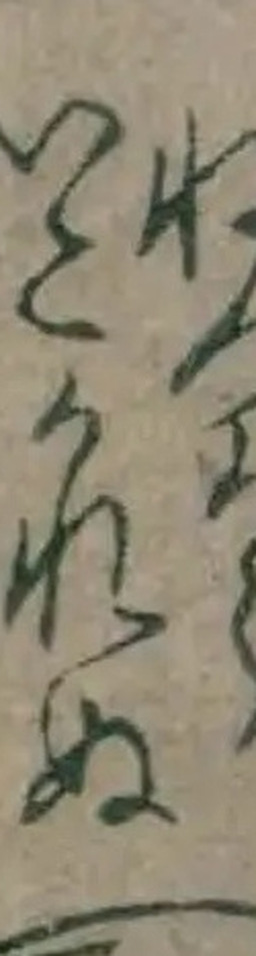いこかれぬ
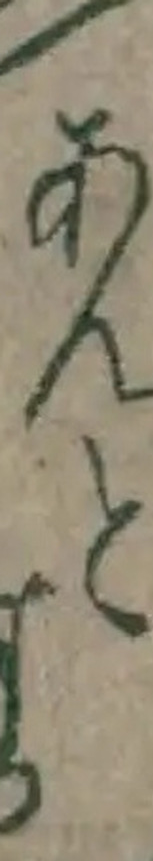あんとする
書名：団十郎蓬芥伝
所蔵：国立国会図書館 National Diet Library, JAPAN
